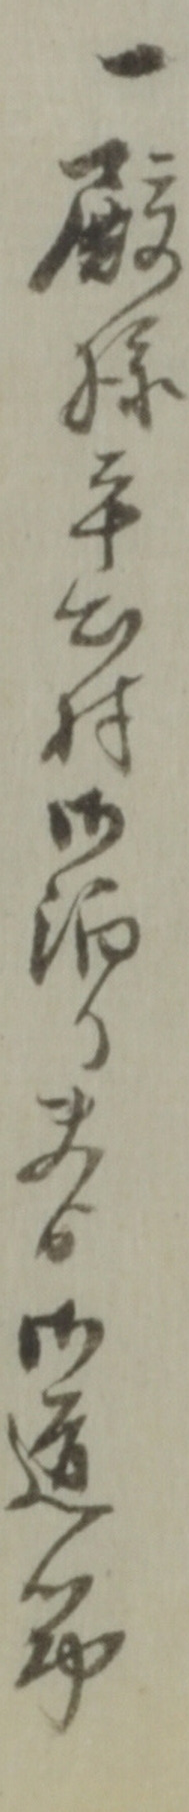一殿様平出村御泊リ夫ゟ御道筋
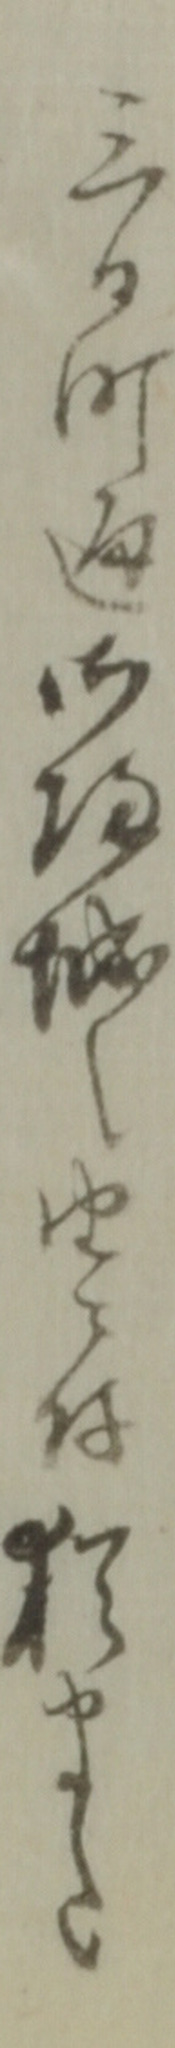三日町通御帰城之由ニ付猶また
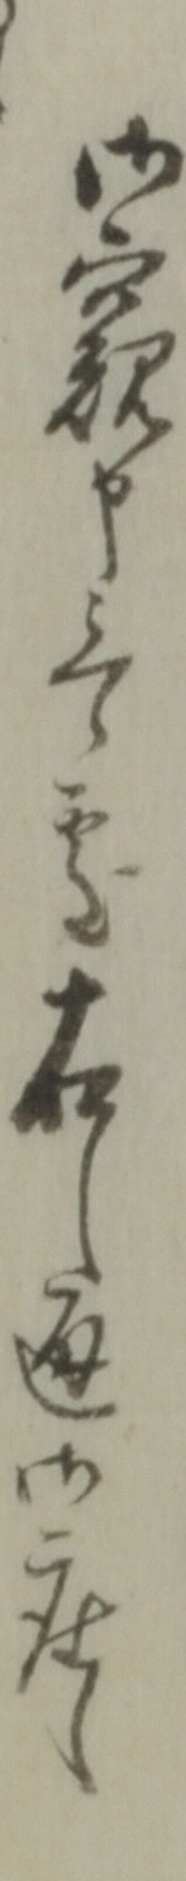御窺申上候処右之通御座候
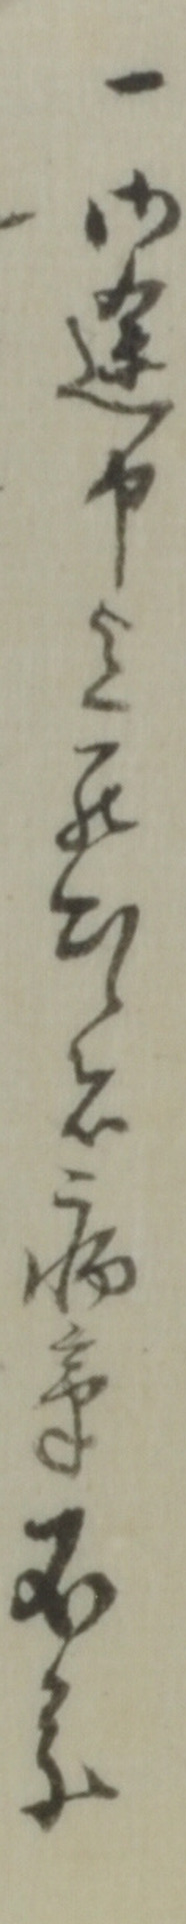一御途中迄罷出候者病気不参
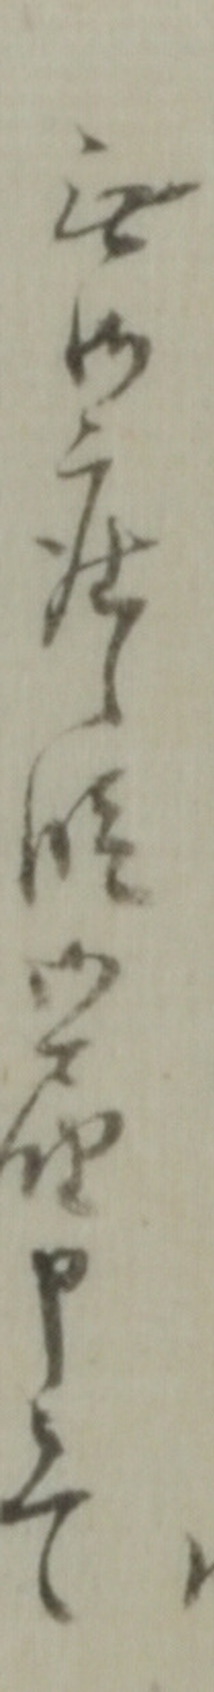無御座候段御届申上候
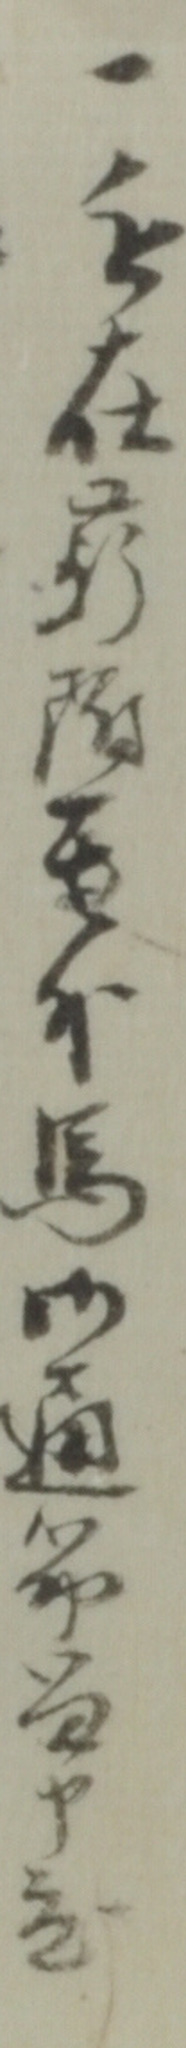一近在薪附其外馬御通筋留申度
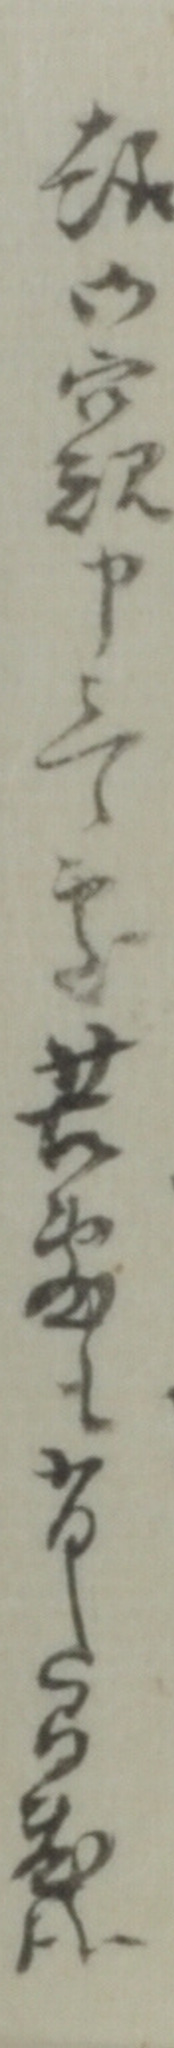趣御窺申上候処苦敷も有之間敷候様
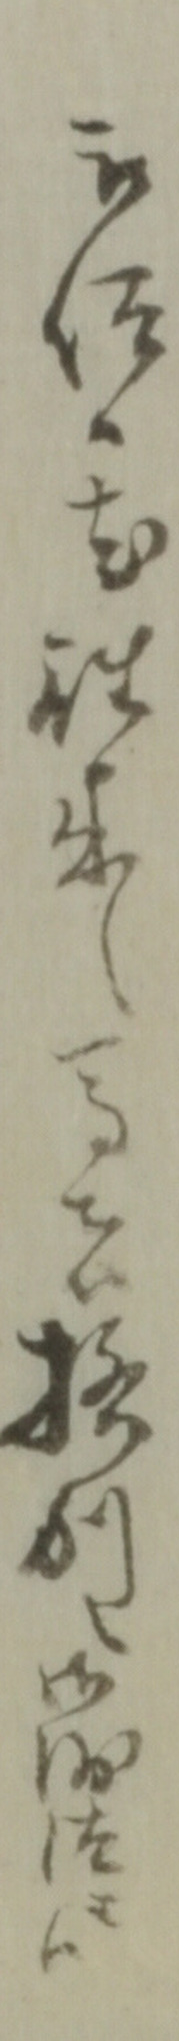被仰候尤往来之馬者格別之御沙汰云々
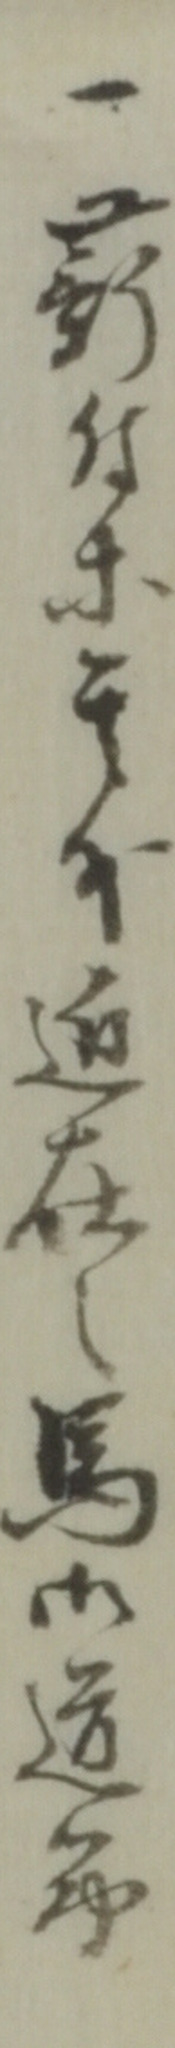一薪付等其外近在之馬御道筋
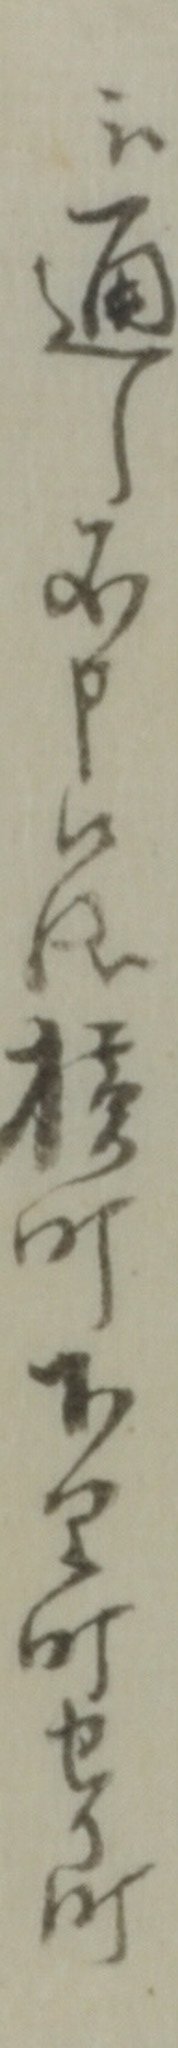被通候不申候様横町下里町せり町
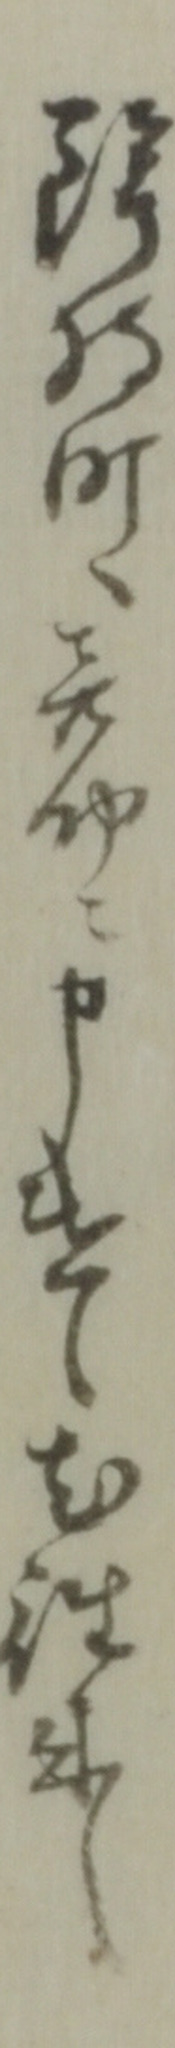鉾持町へ喜助ニ申遣候尤往来之
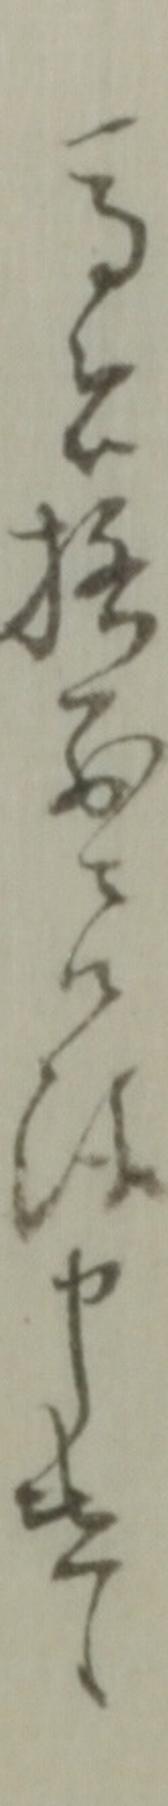馬者格別二候様申遣候
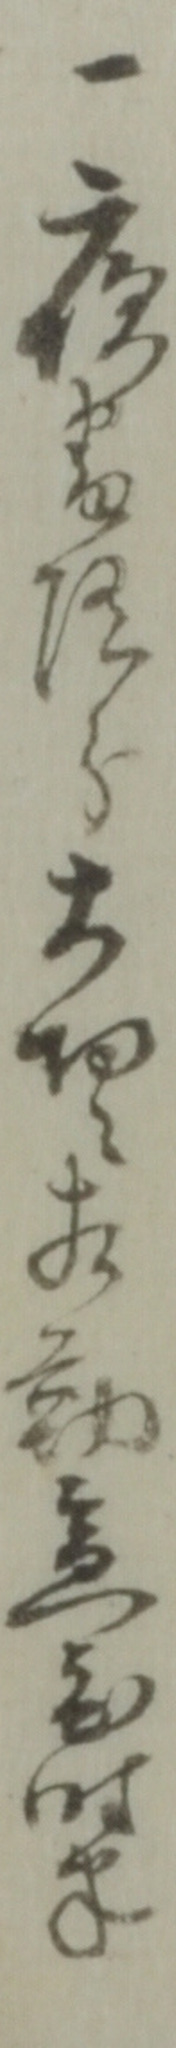一夜番随分大切ニ相勤急度時半
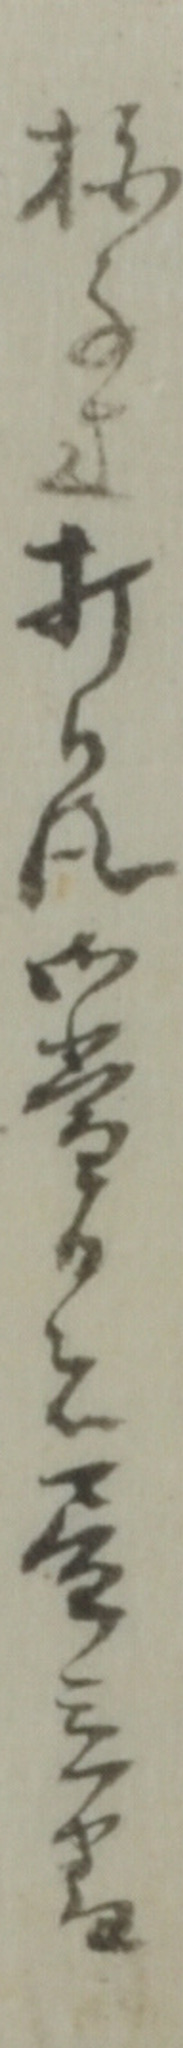様子方打候様御常日者昼立番
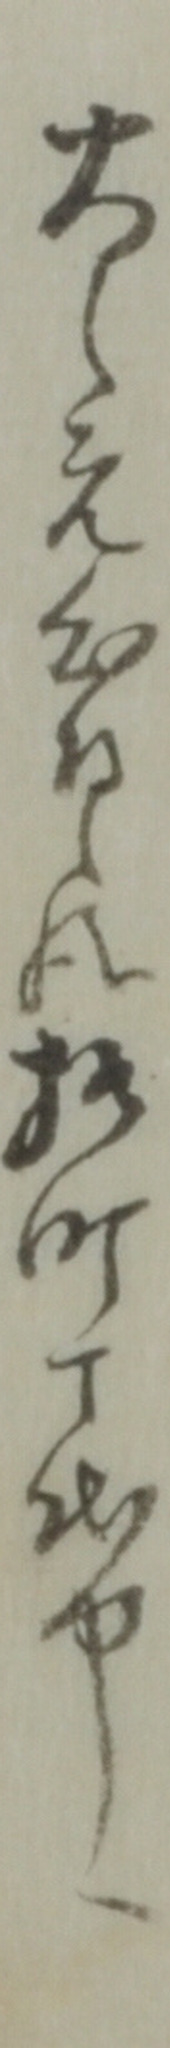火之元心付之様拾町丁代中へ
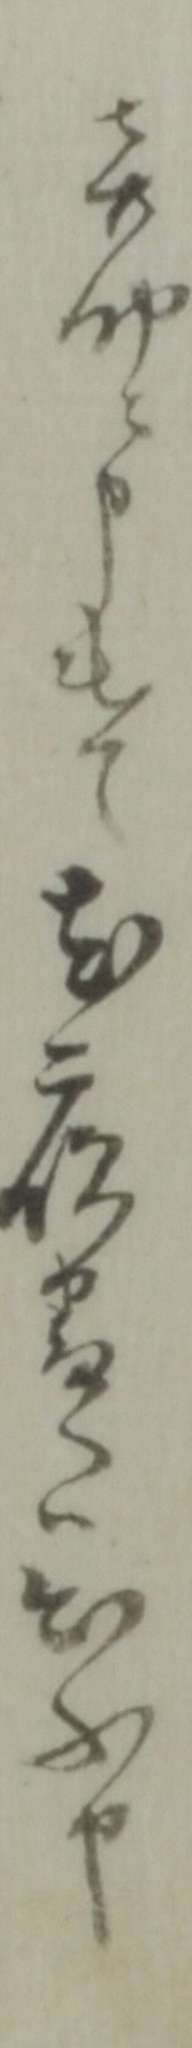喜助ニ申遣候尤夜番ヘハ出不申
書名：御初入諸事控
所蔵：伊那市立高遠町図書館・合同会社AMANE
